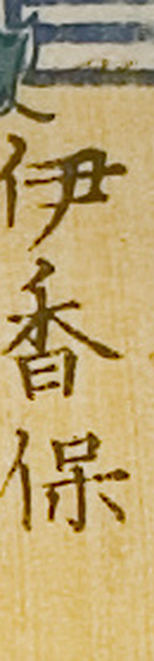伊香保
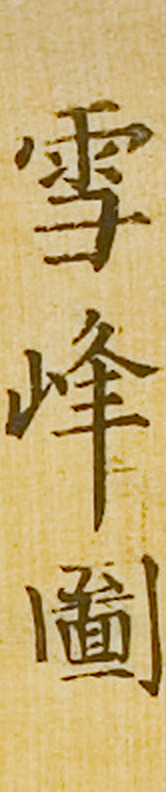雪峰図
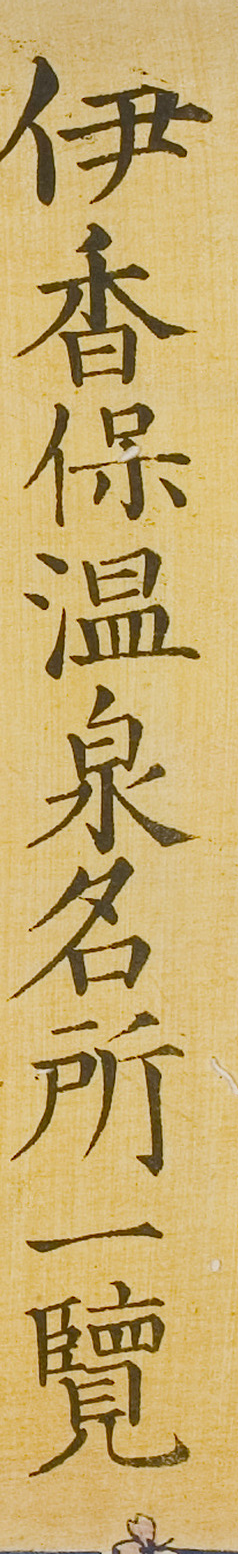伊香保温泉名所一覧
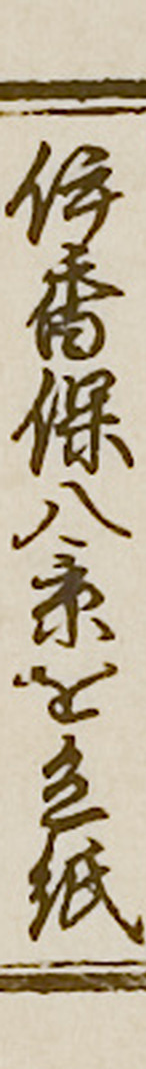伊香保八景を色紙
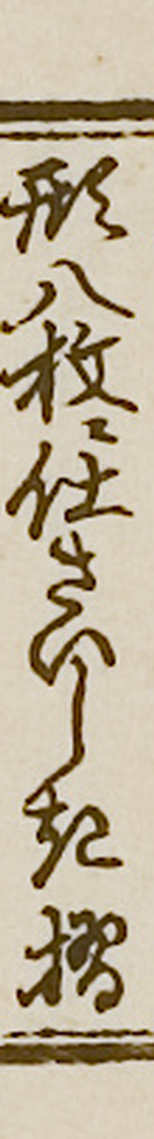形八枚に仕さいしき摺
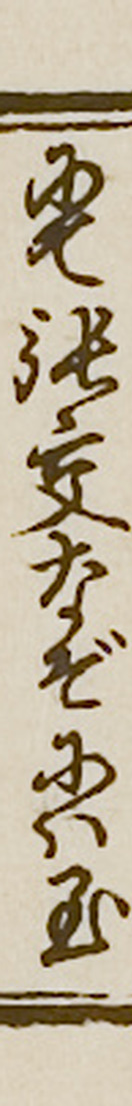にて張交なぞには至
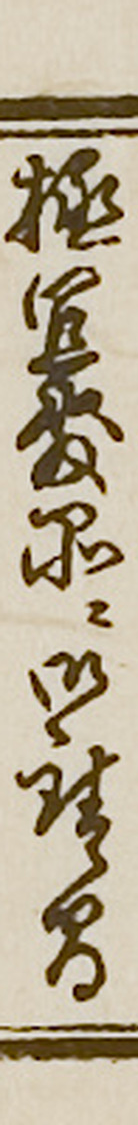極宜敷品に御座候間
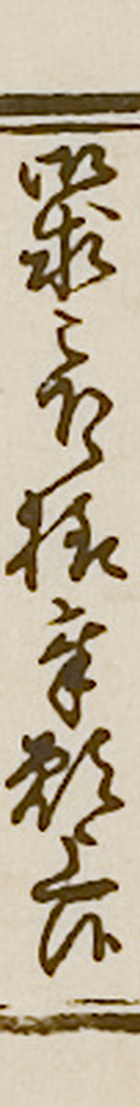御求被下候様奉願上候
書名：伊香保温泉名所一覧
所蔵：東京大学総合図書館 General Library in the University of Tokyo, JAPAN
